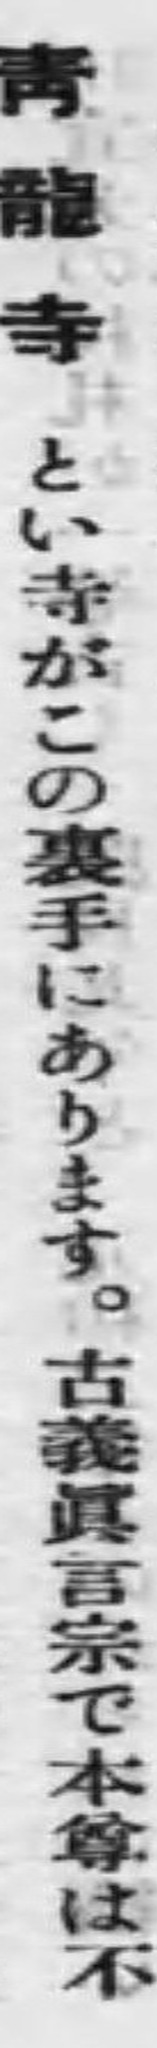青龍寺とい寺がこの裏手にあります。古義真言宗で本尊は不
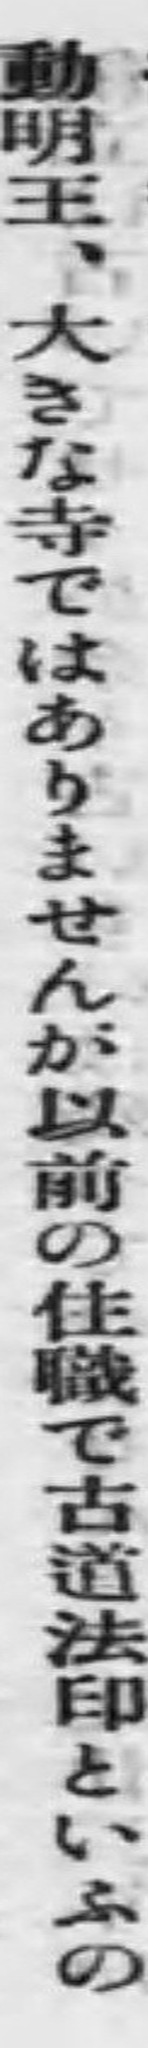動明王、大きな寺ではありませんが以前の住職で古道法印といふの
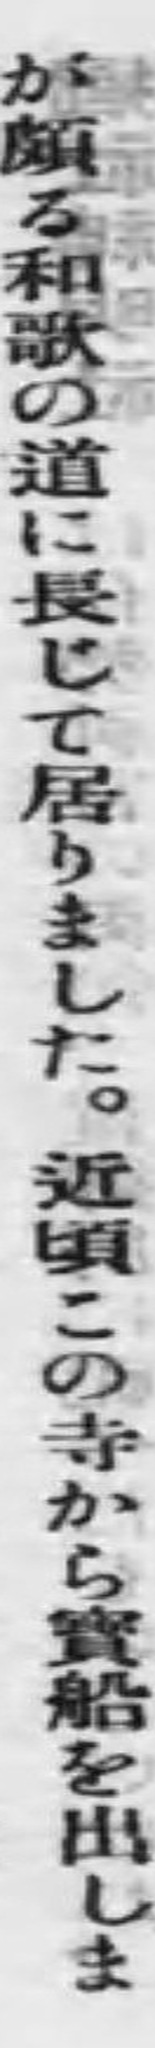が頗る和歌の道に長じて居りました。近頃この寺から宝船を出しま
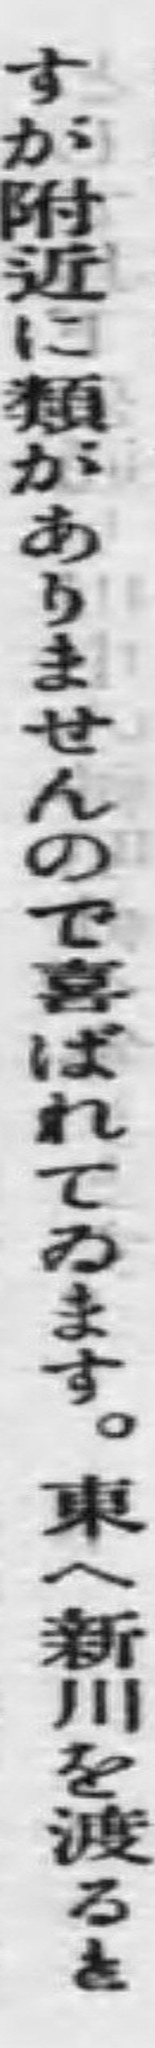すが附近に類がありませんので喜ばれてゐます。東へ新川を渡ると
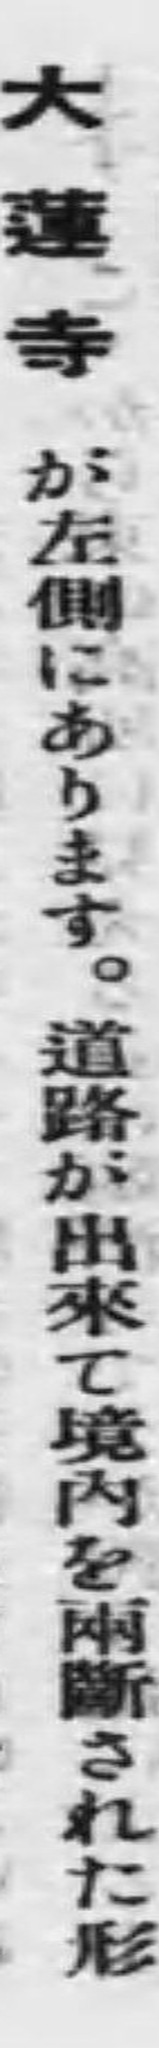大蓮寺が左側にあります。道路が出来て境内を両断された形
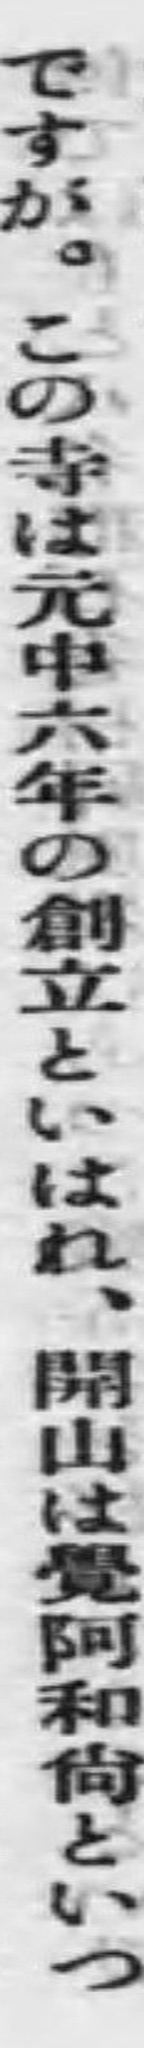ですが。この寺は元中六年の創立といはれ、開山は覚阿和尚といつ
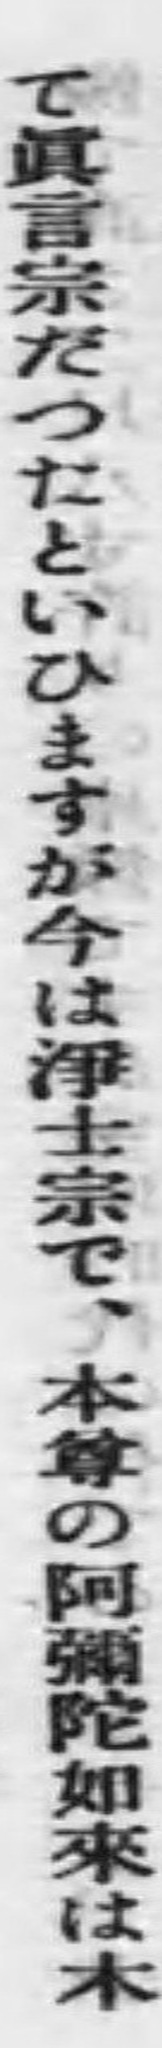て真言宗だつたといひますが今は浄土宗で、本尊の阿弥陀如来は木

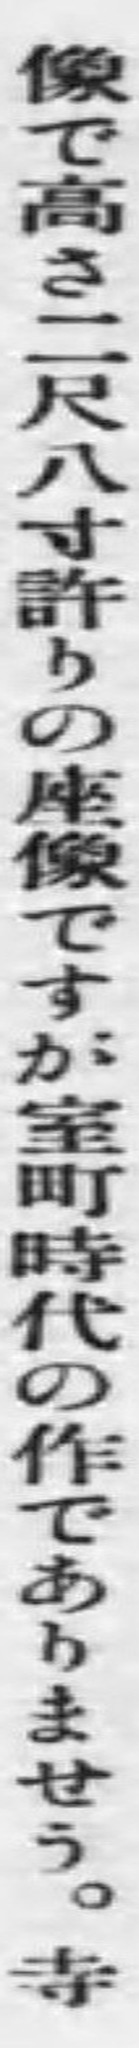像で高さ二尺八寸許りの座像ですが室町時代の作でありませう。寺
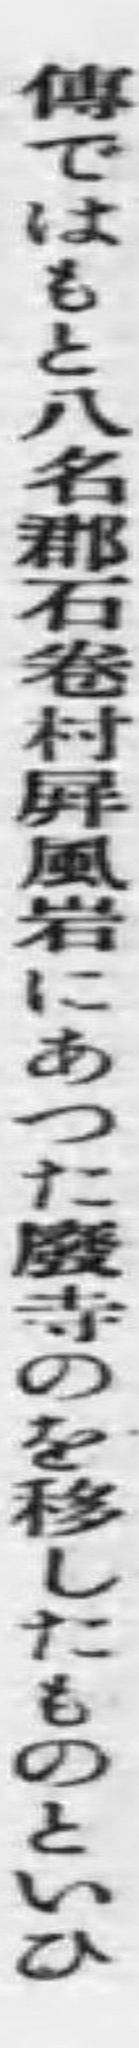伝ではもと八名郡石巻村屏風岩にあつた廃寺のを移したものといひ
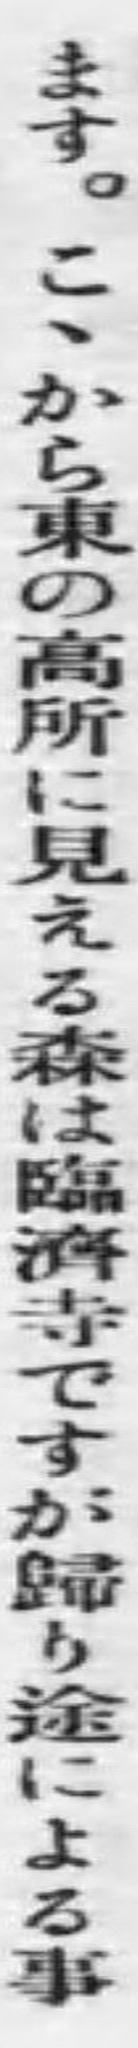ます。こゝから東の高所に見える森は臨済寺ですが帰り途による事
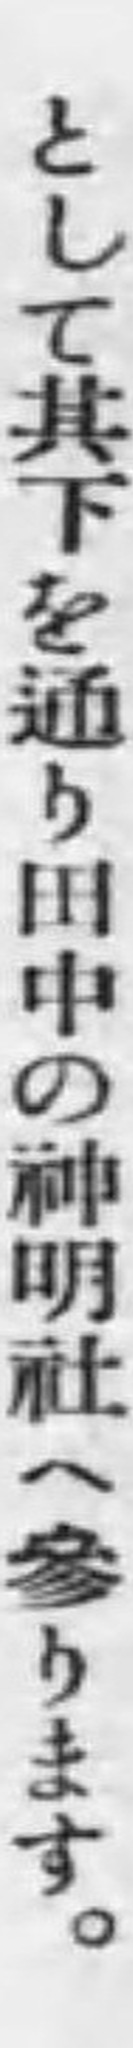として其下を通り田中の神明社へ参ります。
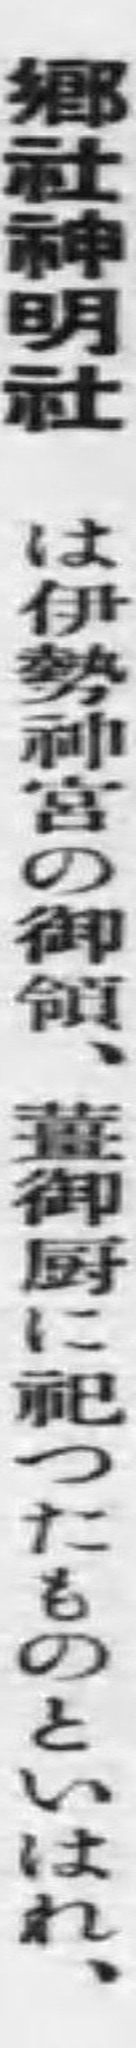郷社神明社は伊勢神宮の御領、薑御厨に祀つたものといはれ、
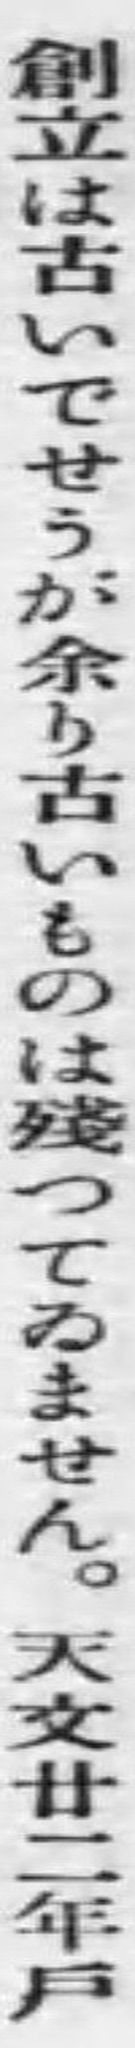創立は古いでせうが余り古いものは残つてゐません。天文廿二年戸
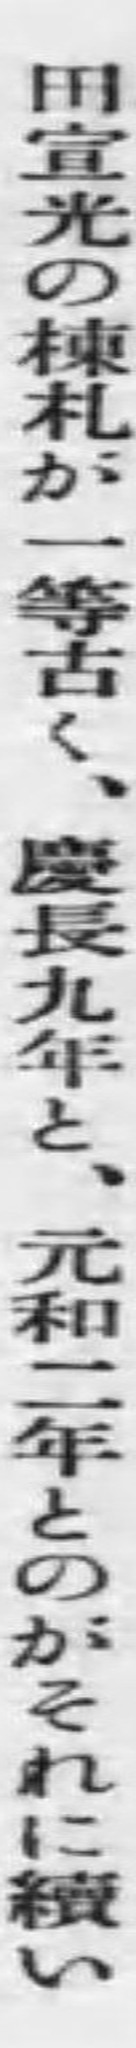田宣光の棟札が一等古く、慶長九年と、元和二年とのがそれに続い
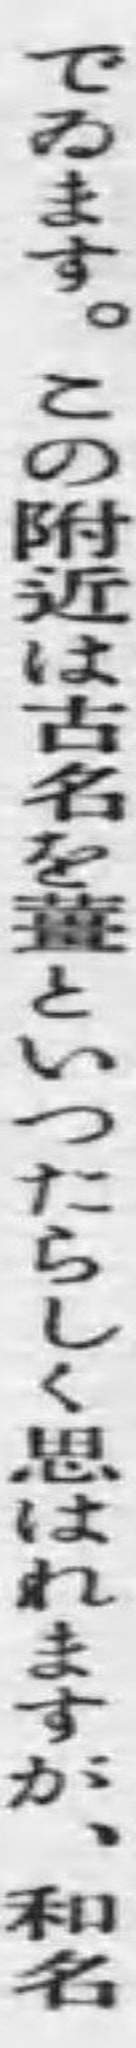てゐます。この附近は古名を薑といつたらしく思はれますが、和名
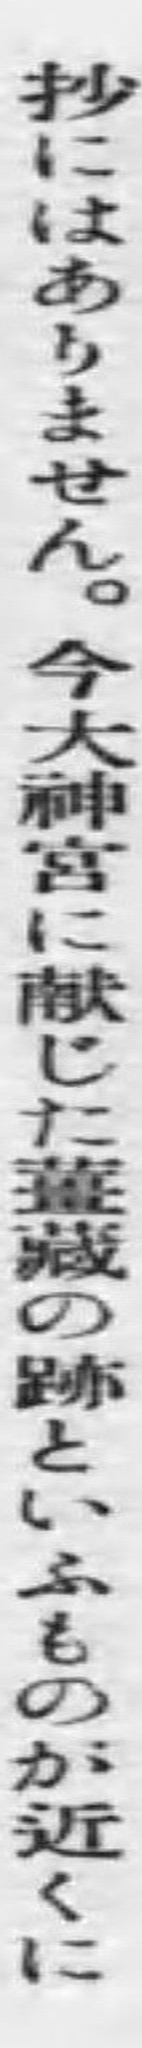抄にはありません。今大神宮に献じた薑蔵の跡といふものが近くに
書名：東三河道中記 : 豊橋市及其附近案内
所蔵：国立国会図書館 National Diet Library, JAPAN
